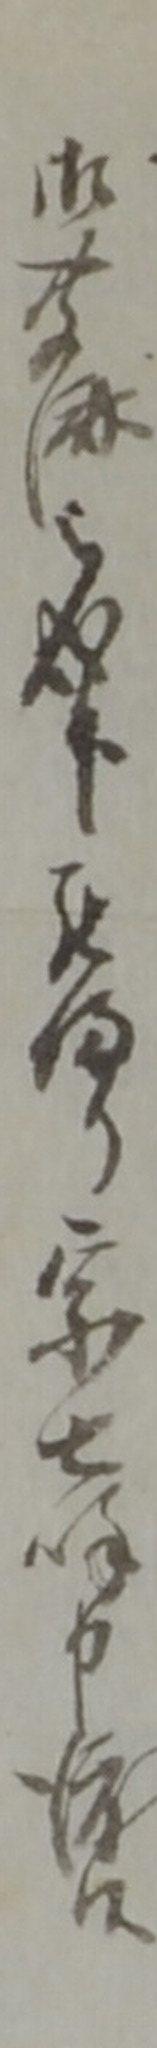御聞済被成下罷留り宗七呼申渡候
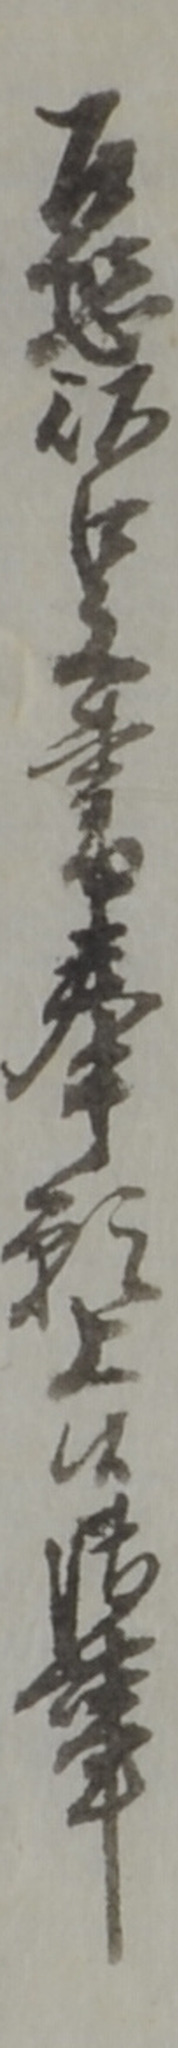乍恐以口上書奉願上候御事
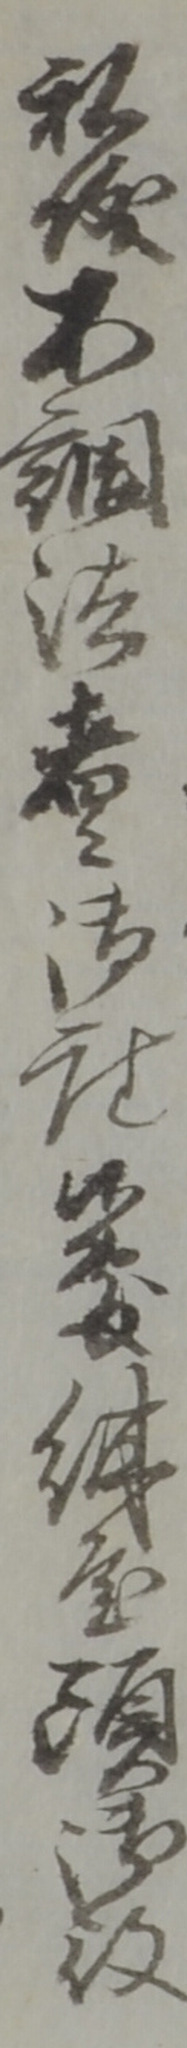私儀不調法者ニ御座候處紺屋頭御役
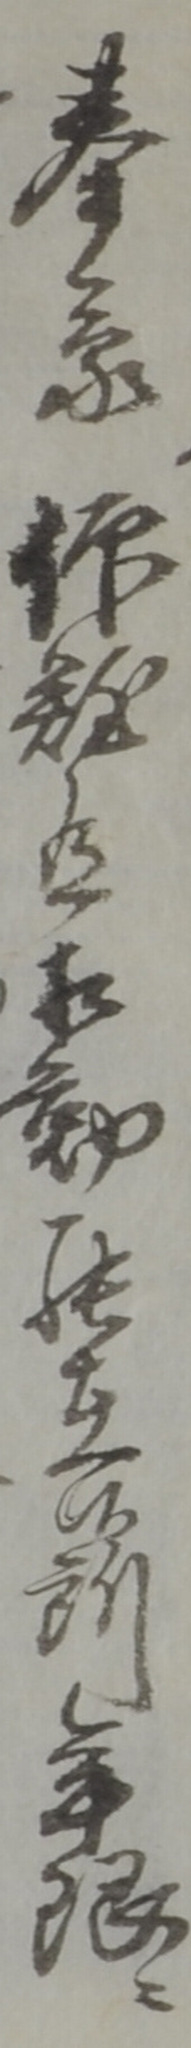奉蒙仰難有相勤罷在候所年限ニ
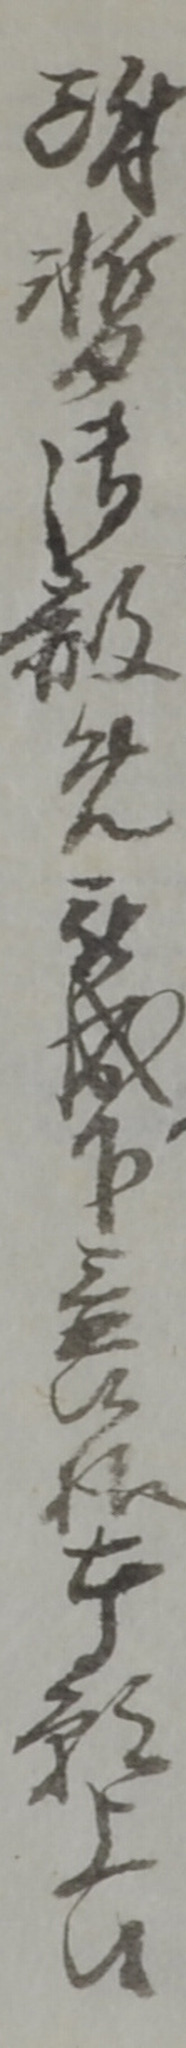附暫御赦免被成下置候様奉願上候
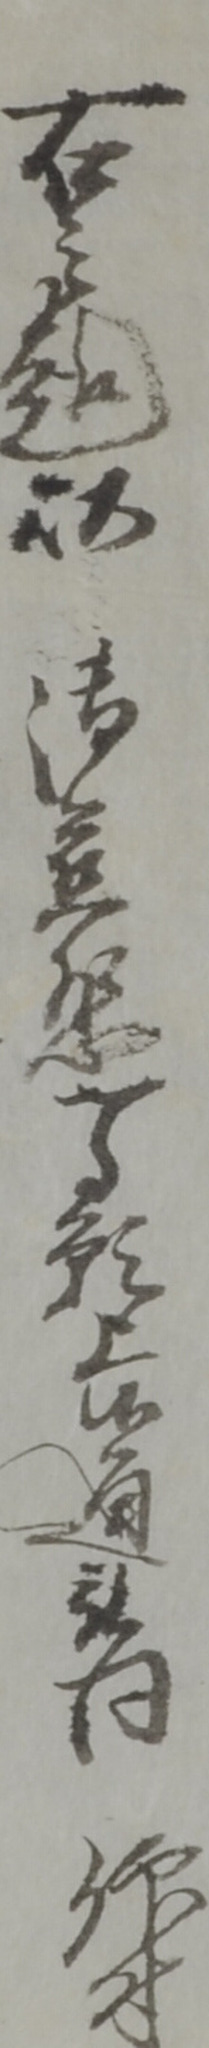右之趣以御慈悲奉願上候通被為仰付
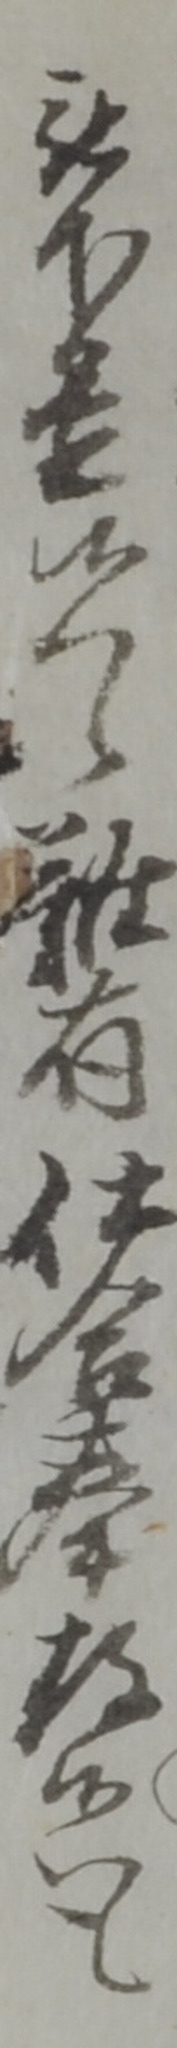被下置候ハヽ難有仕合奉存候以上
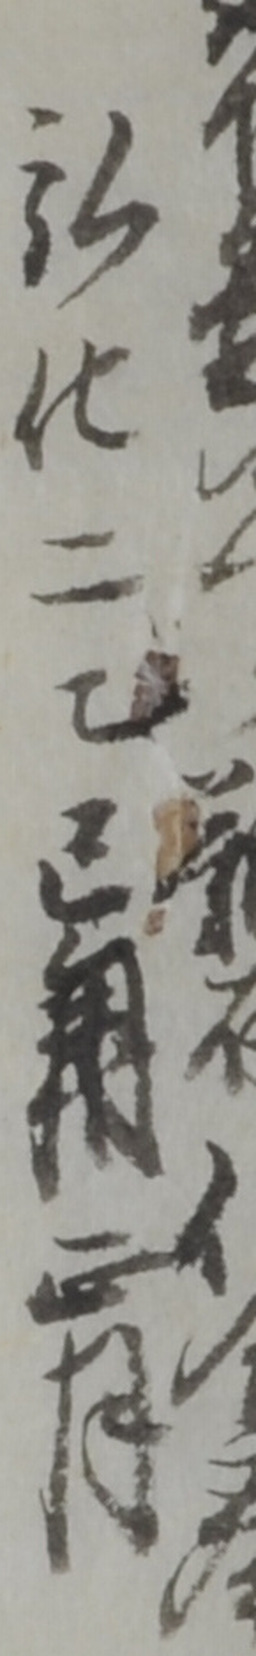弘化二乙巳年正月

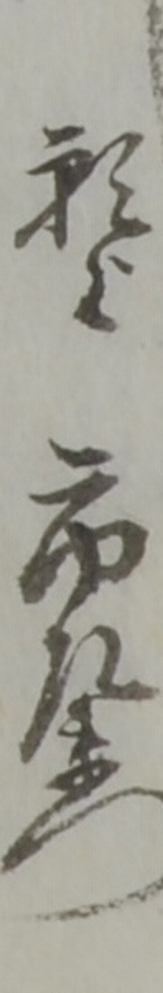願主市左衛門
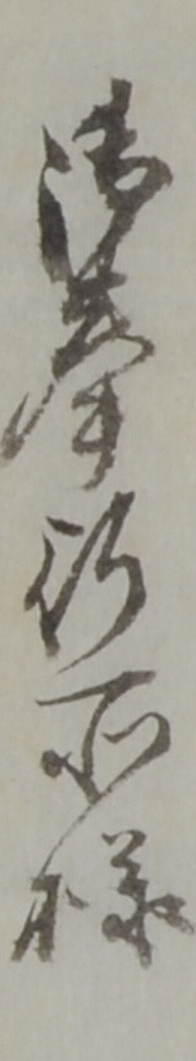御奉行所様
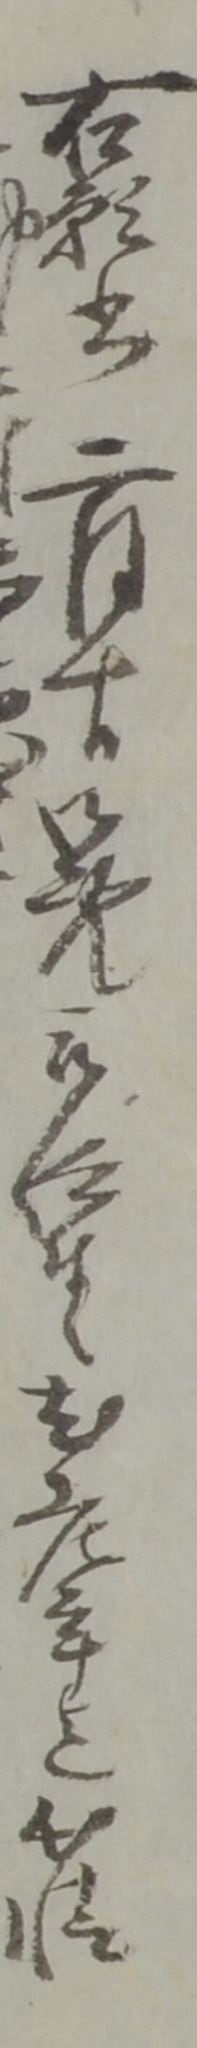右願書二月十日御免被仰付候尤老年迄出情
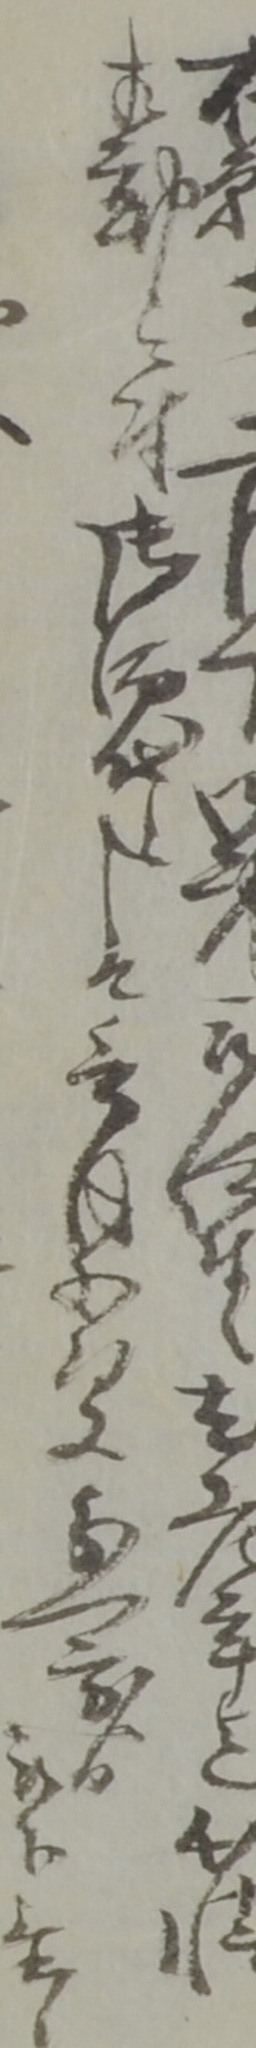相勤候ニ付御酒代として二月五日に与一方ゟ被下置候
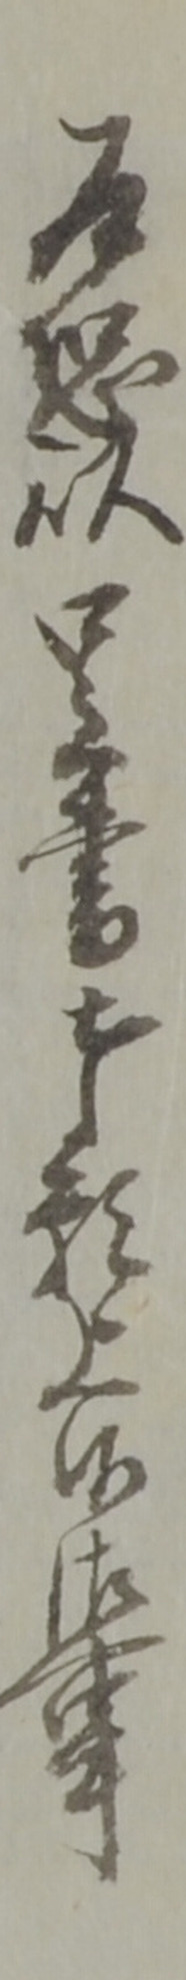乍恐以口上書奉願上候御事
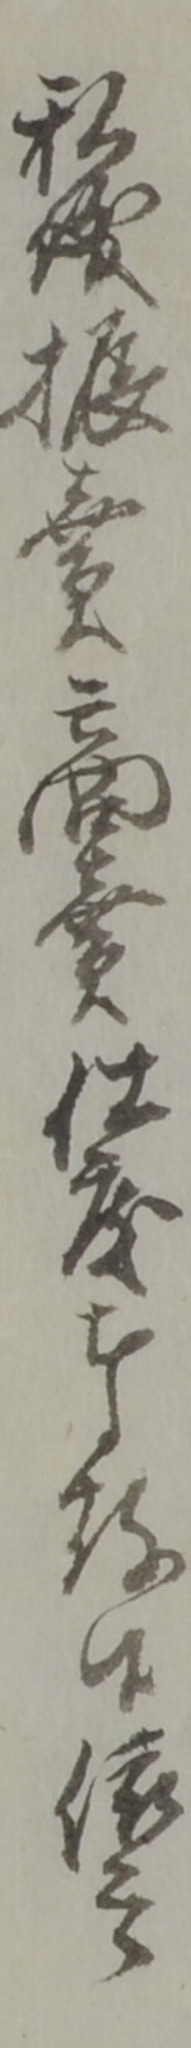私儀振売商売仕度奉存候依之
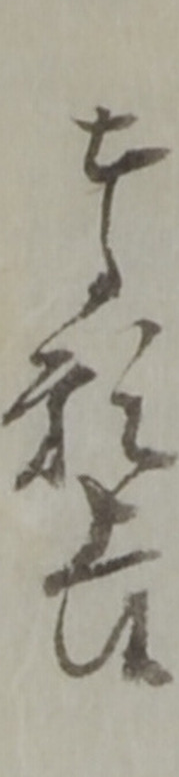奉願上候
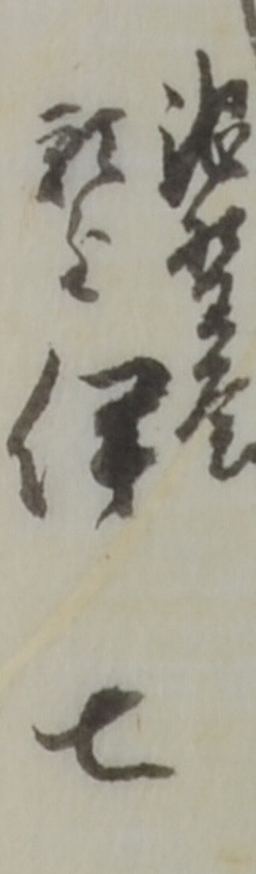願主伊七
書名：諸願書控簿
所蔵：伊那市立高遠町図書館・合同会社AMANE
